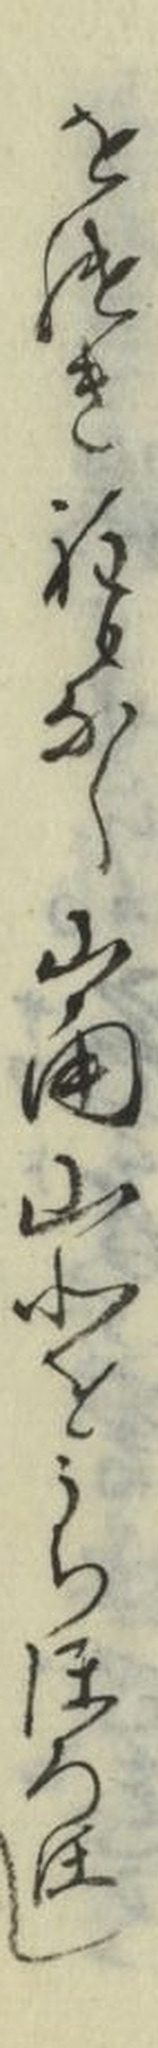を継き程もなく山南山北をうちほろほし
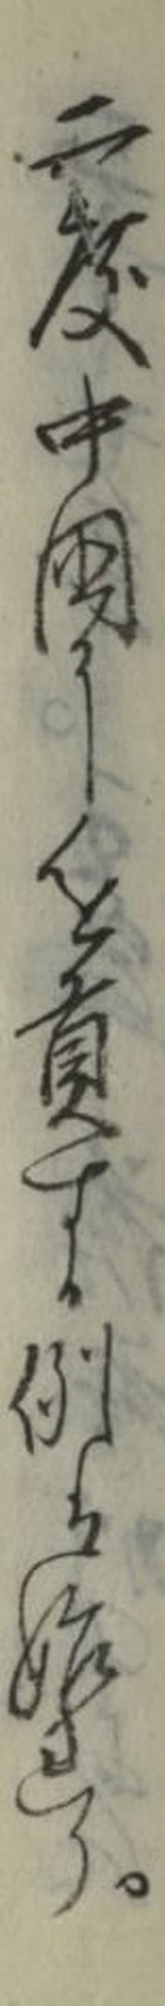二度中国に遣貢する例は始れり。
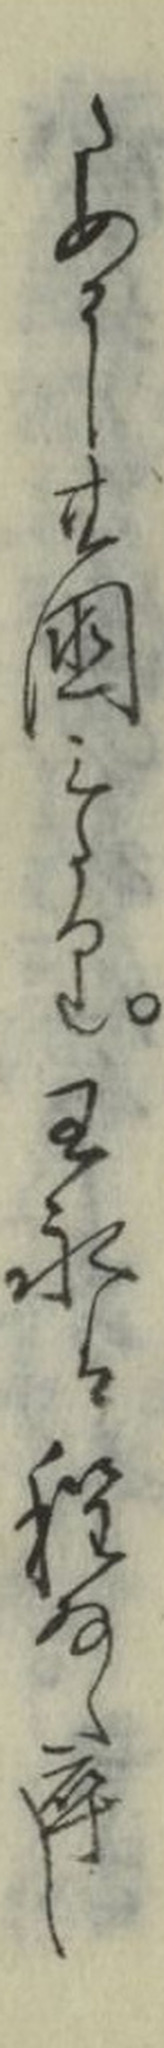ために其国みたり。王永は程なく卒し
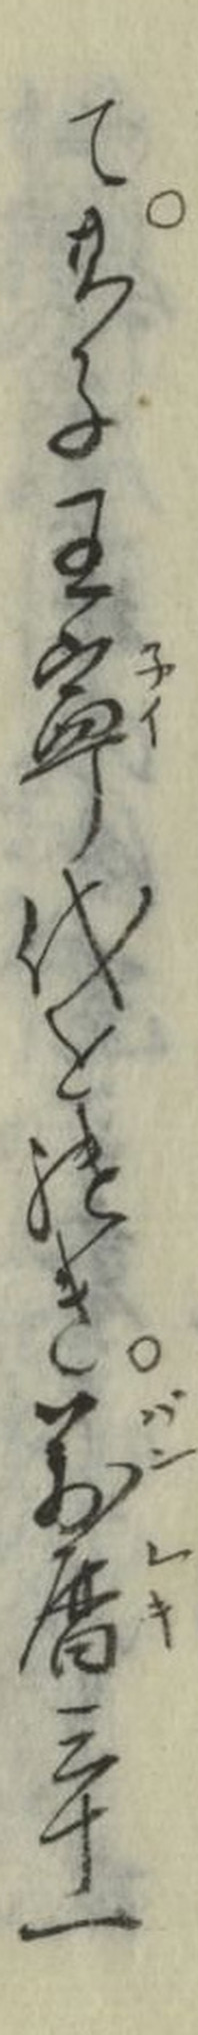て。其子王寧代を継き。万暦三十一
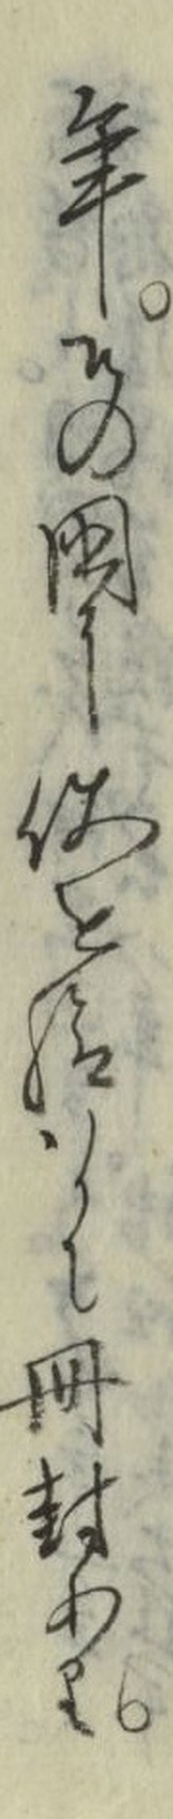年。その国に使を給はりて冊封あり。

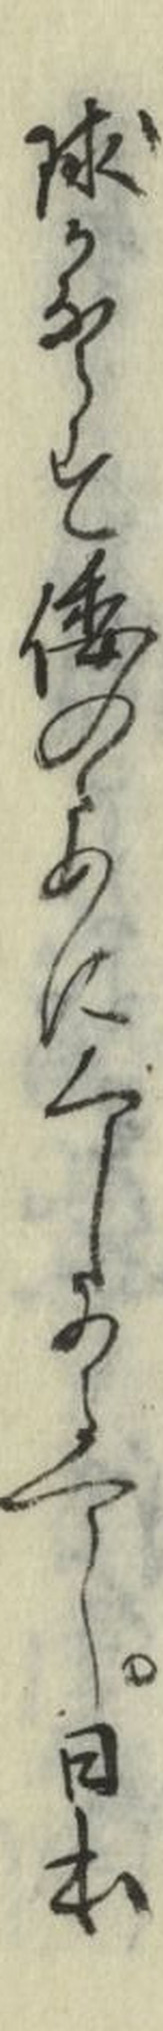球かならす倭のためにくたかるへし。日本
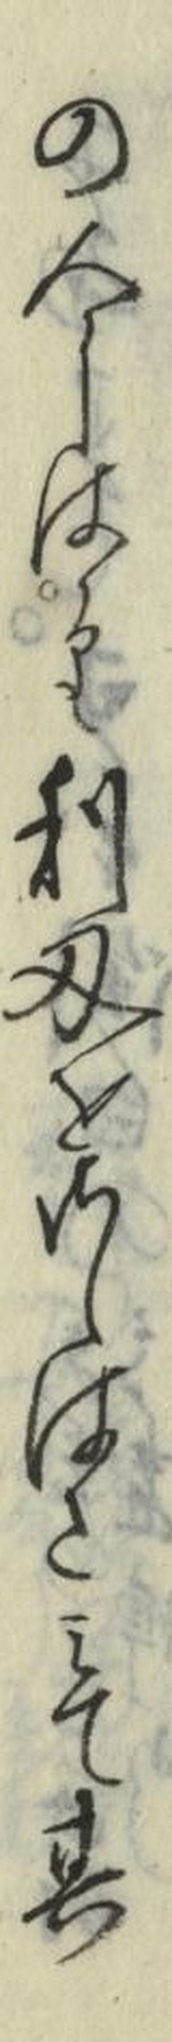の人にはかり利刃をさしはこみて其
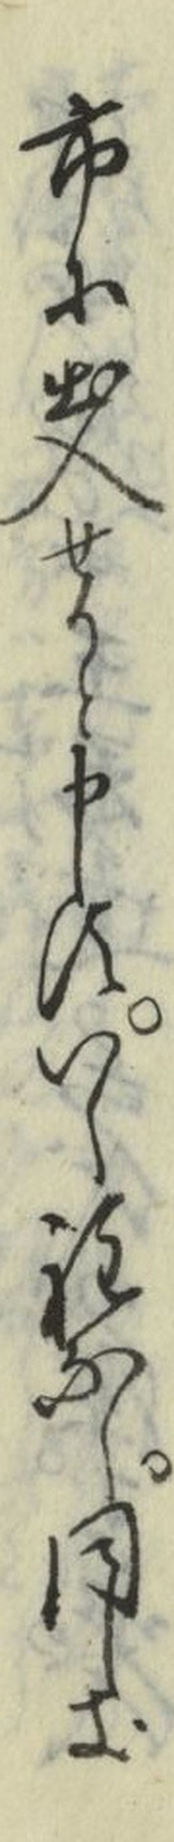市に出入せりと申す。いく程なく。同き
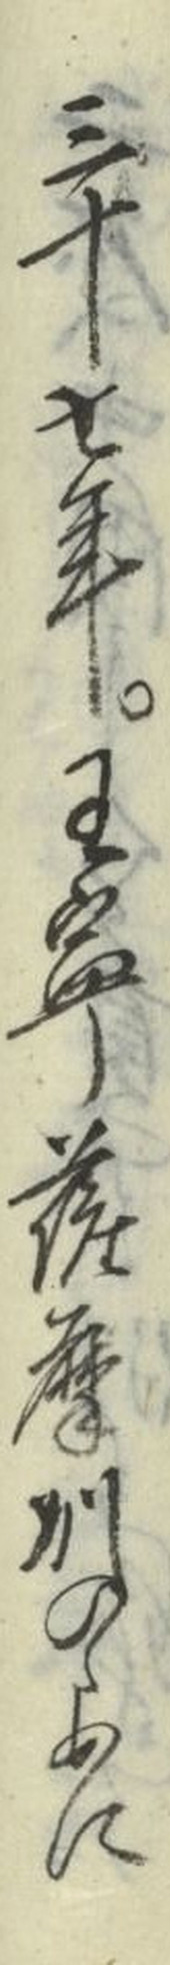三十七年。王寧薩摩州のために
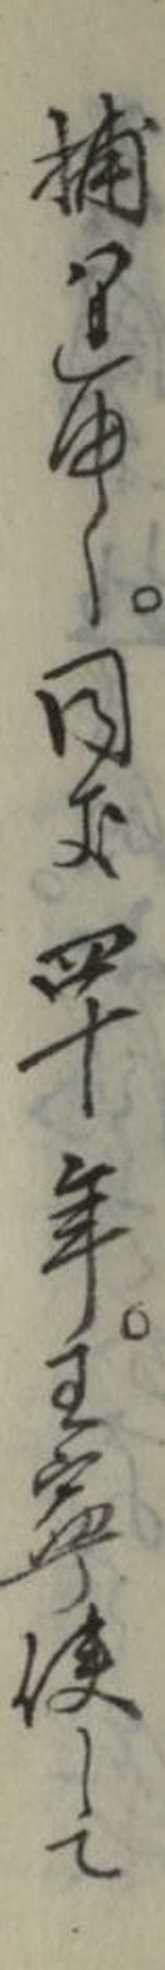捕はれ申し。同き四十年。王寧使して
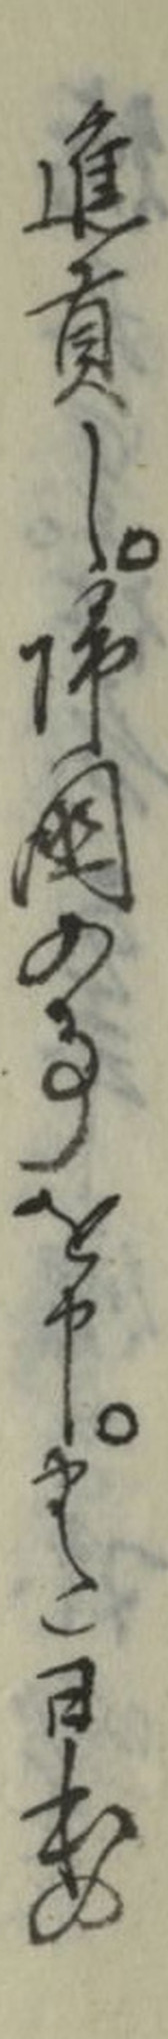進貢し。帰国の事を申。また日本の

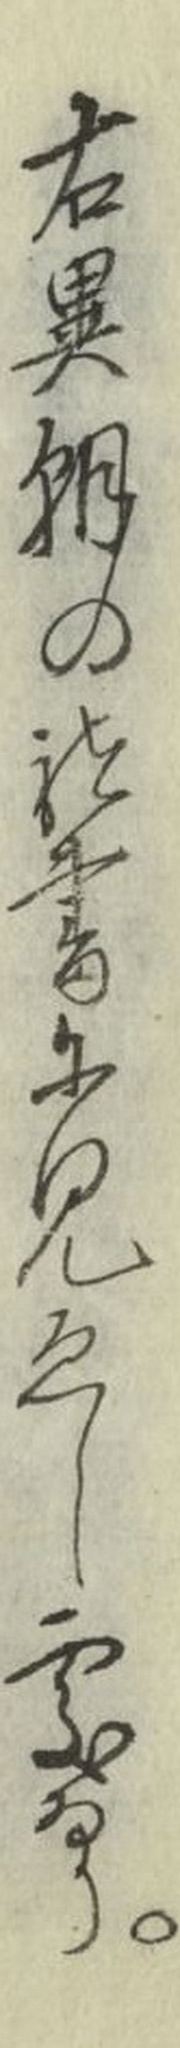右異朝の諸書に見へし処なり。
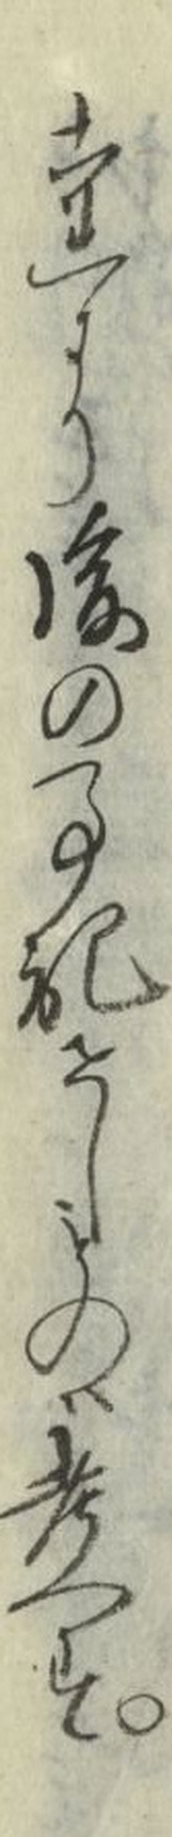これより後の事記せしものは考へす。
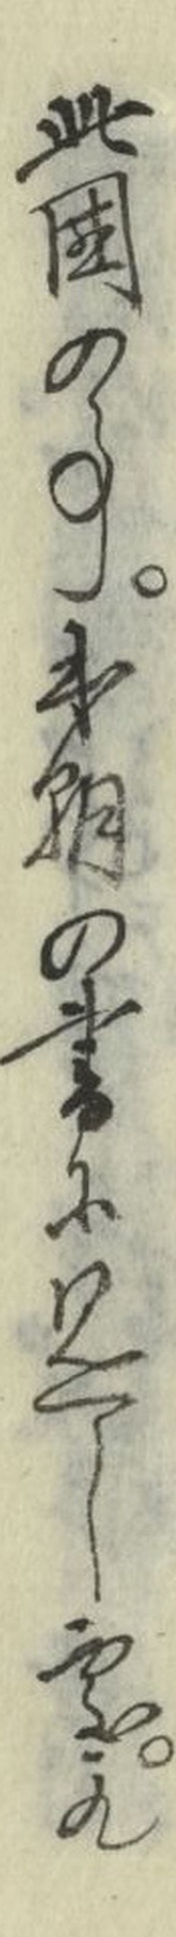此国の事。本朝の書に見へし処。これ
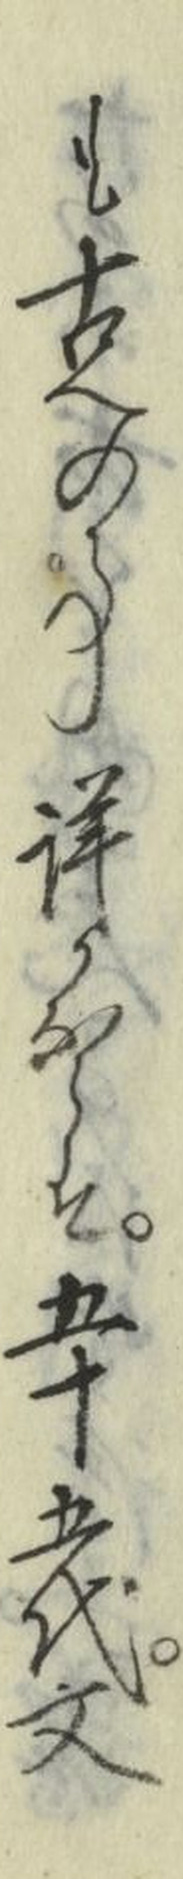も古への事詳かならす。五十五代文
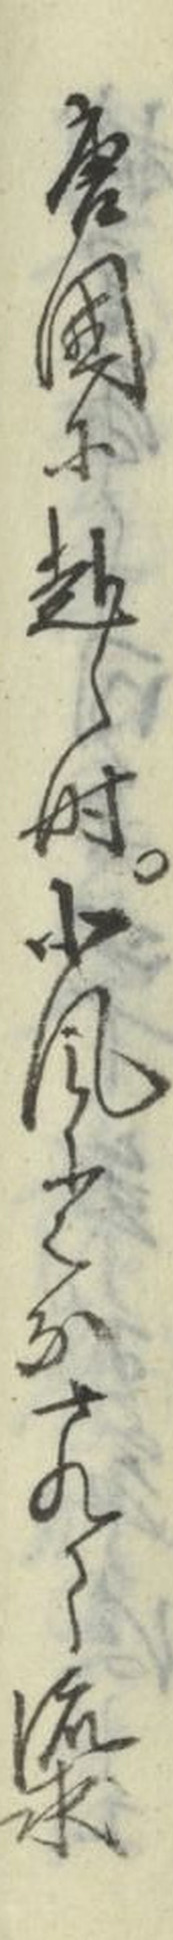唐国に赴く時。北風にて流されて流求
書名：琉球人来朝記 一之二
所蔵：University of the Ryukyus Library
